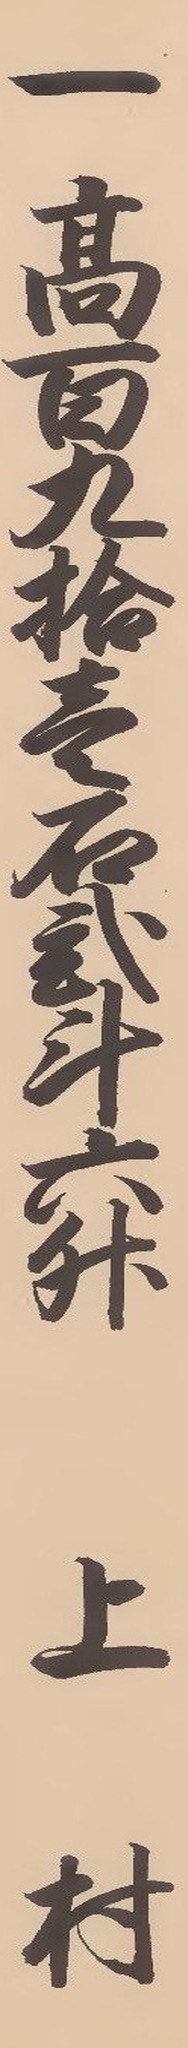一高百九拾壱石弐斗六升上村
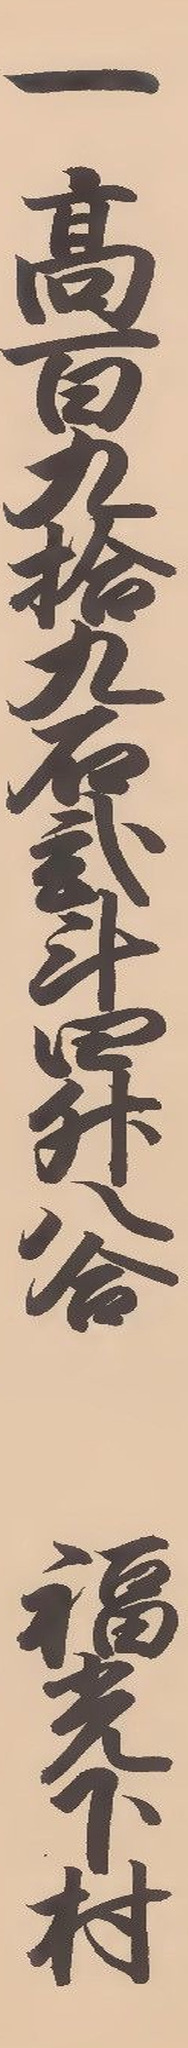一高百九拾九石弐斗四升八合福光下村
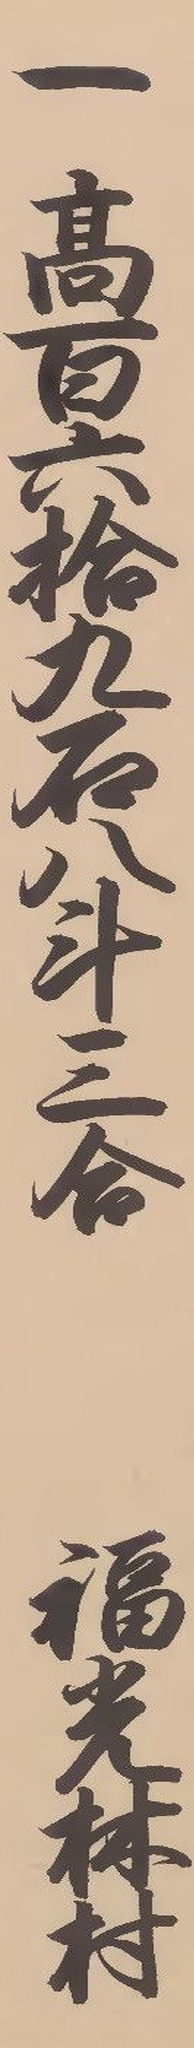一高百六拾九石八斗三合福光林村
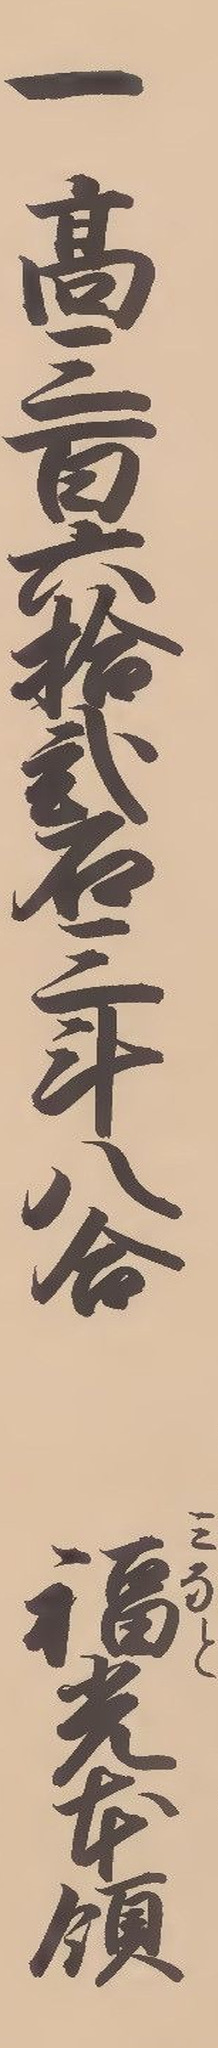一高三百六拾弐石三斗八合福光本領
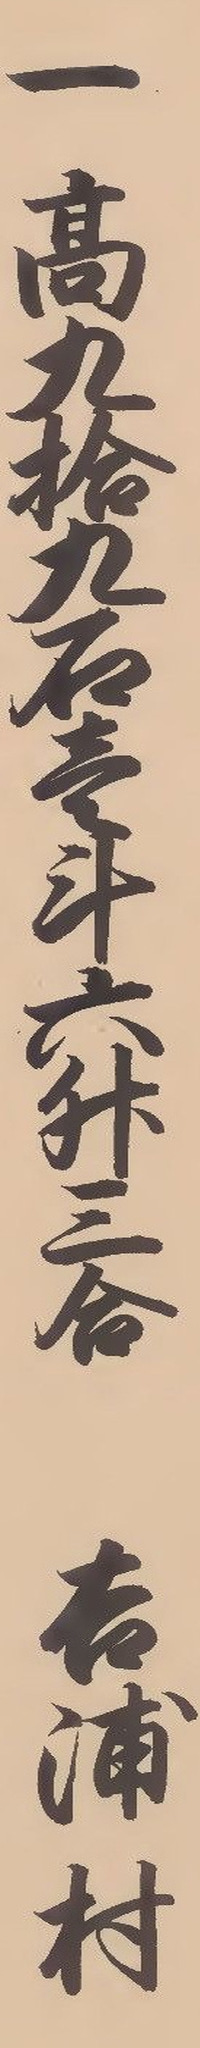一高九拾九石壱斗六升三合吉浦村
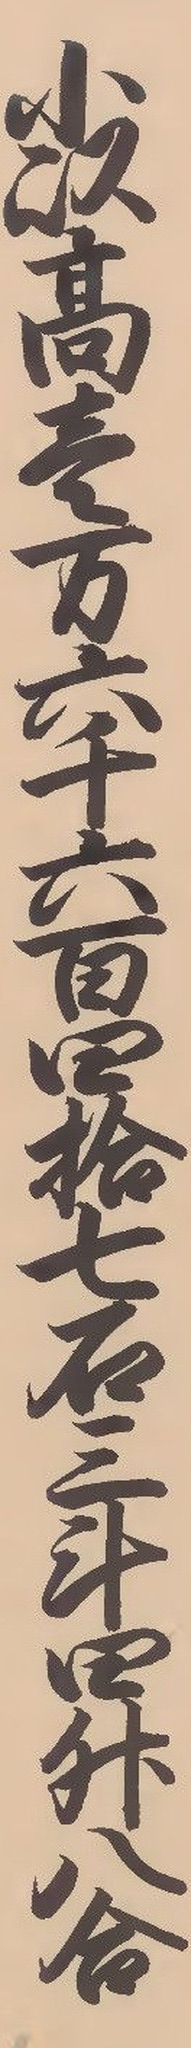小以高壱万六千六百四拾七石三斗四升八合

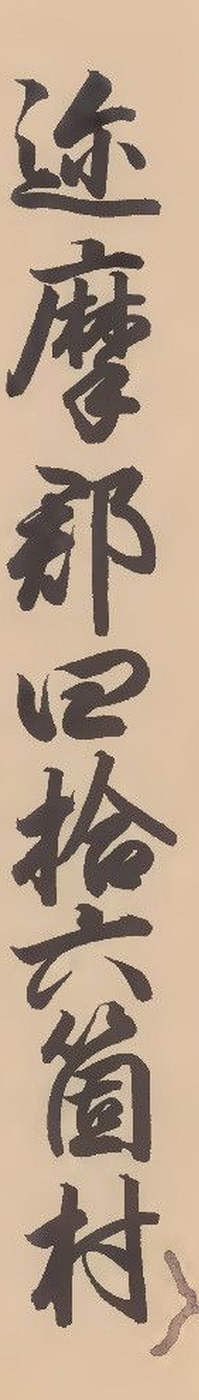迩摩郡四拾六箇村
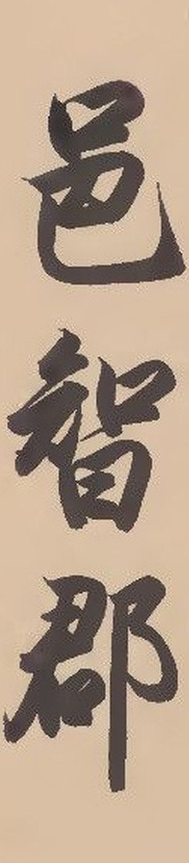邑智郡
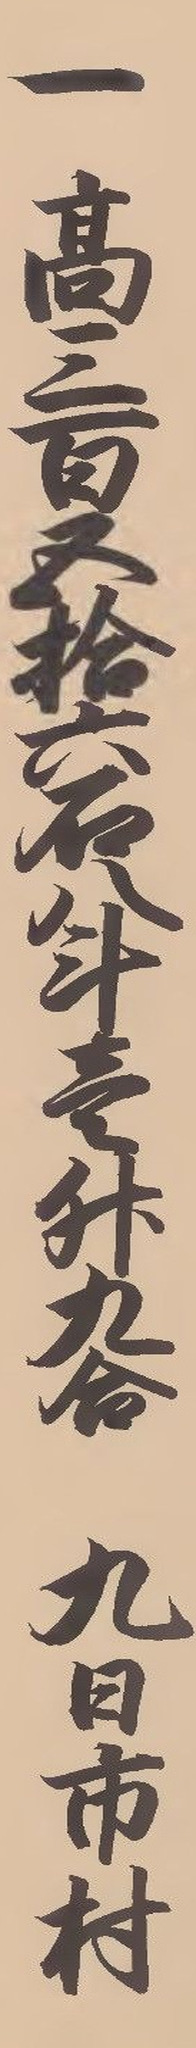一高三百五拾六石八斗壱升九合九日市村
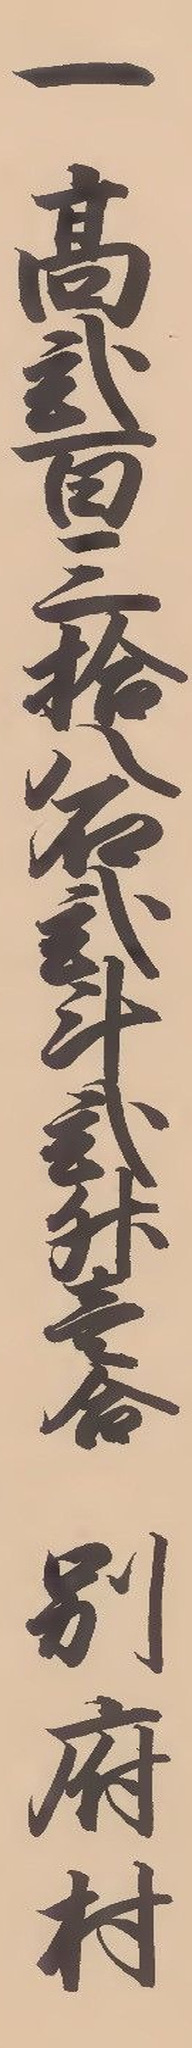一高弐百三拾八石弐斗弐升壱合別府村
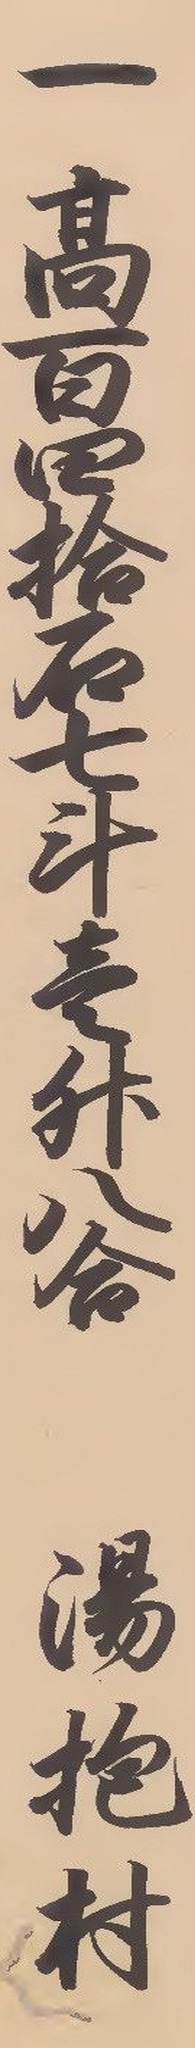一高百四拾石七斗壱升八合湯抱村

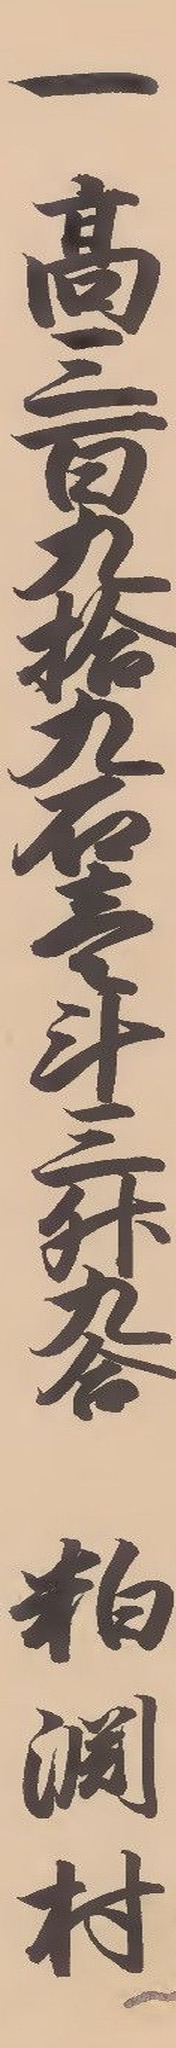一高三百九拾九石壱斗三升九合粕淵村
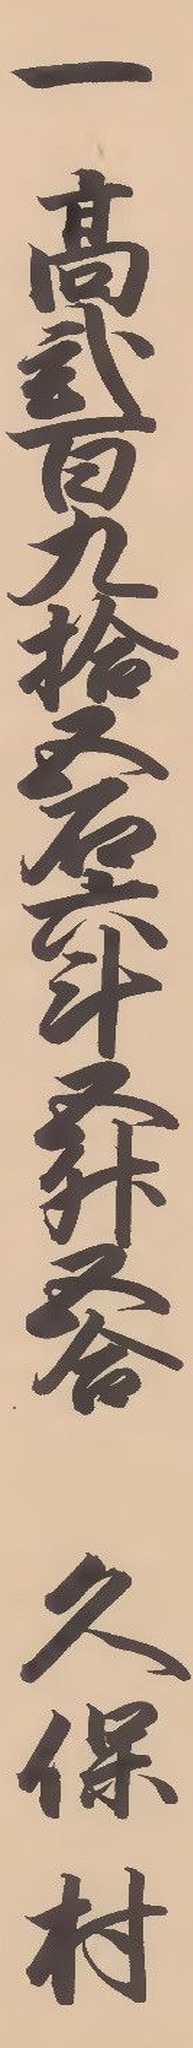一高弐百九拾五石六斗五升五合久保村
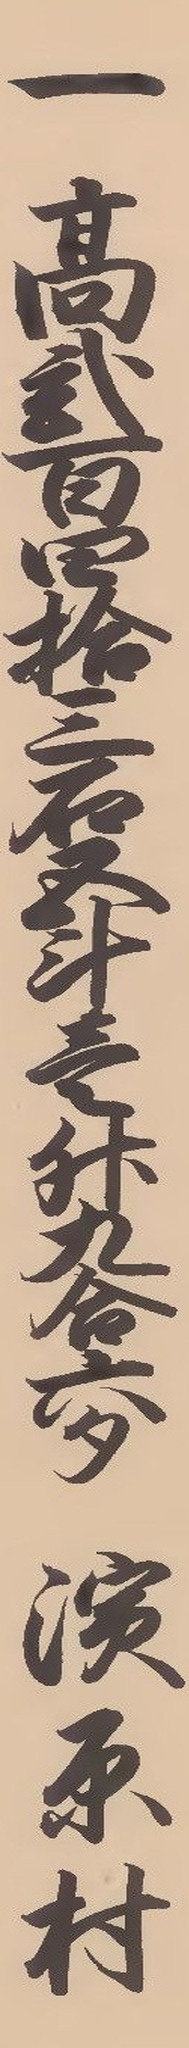一高弐百四拾三石五斗壱升九合六夕浜原村
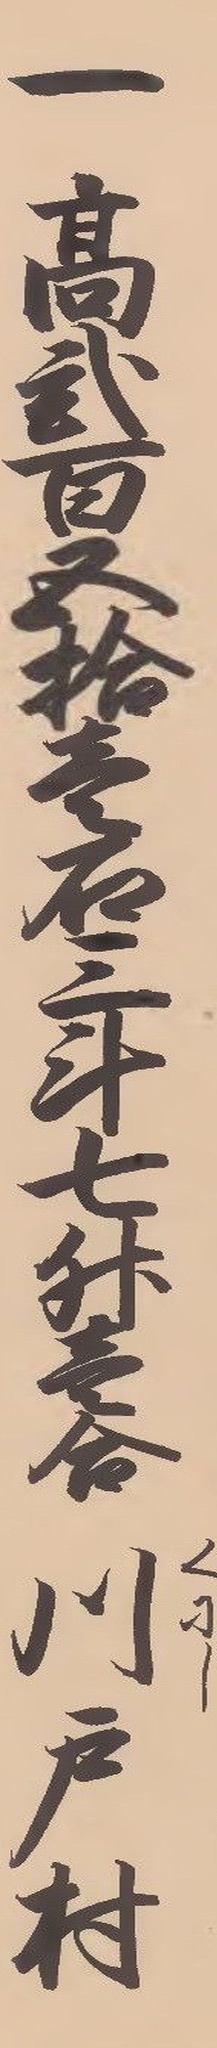一高弐百五拾壱石三斗七升壱合川戸村
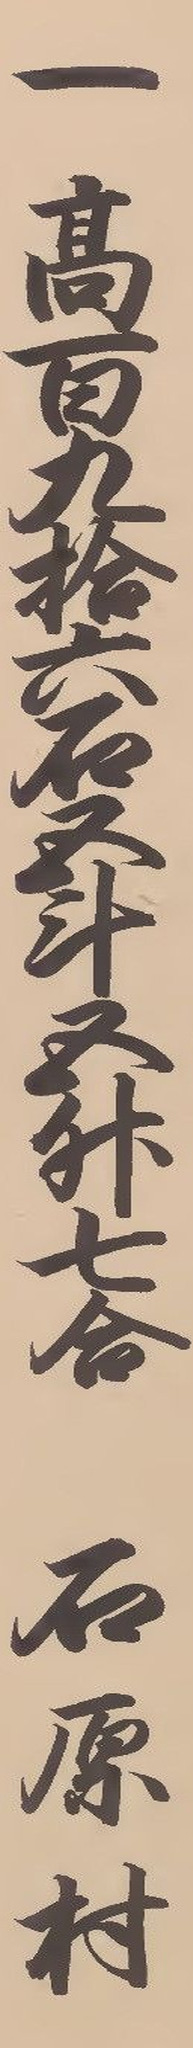一高百九拾六石五斗五升七合石原村
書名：石見国郷帳
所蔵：国立公文書館 National Archives of Japan
